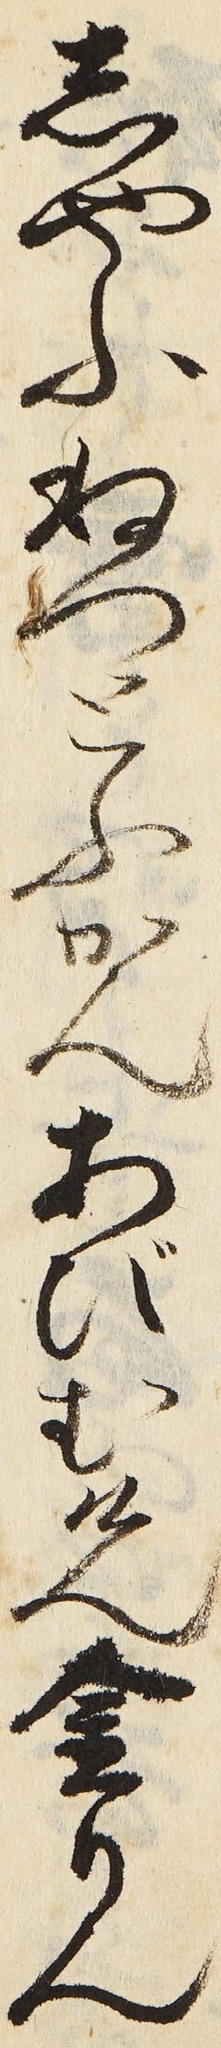しやふねつとふかんあびむけん金りん
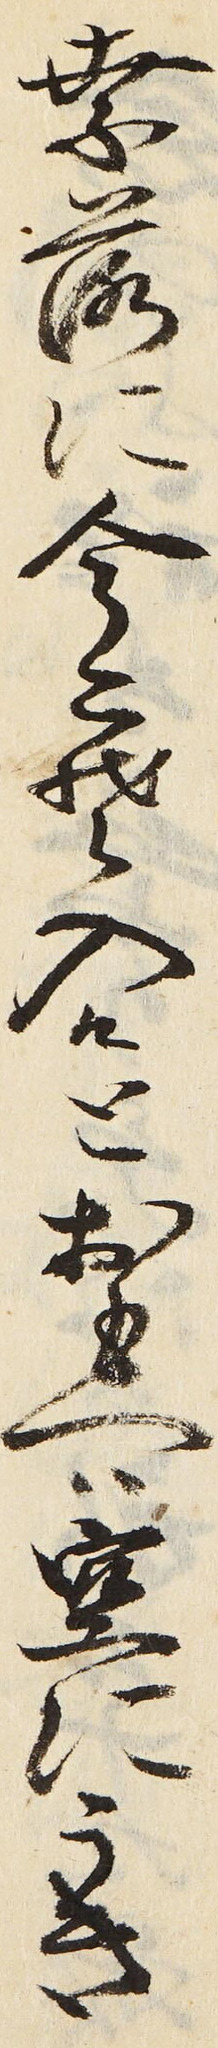幸落に今こそ入るとおもへは空にうき
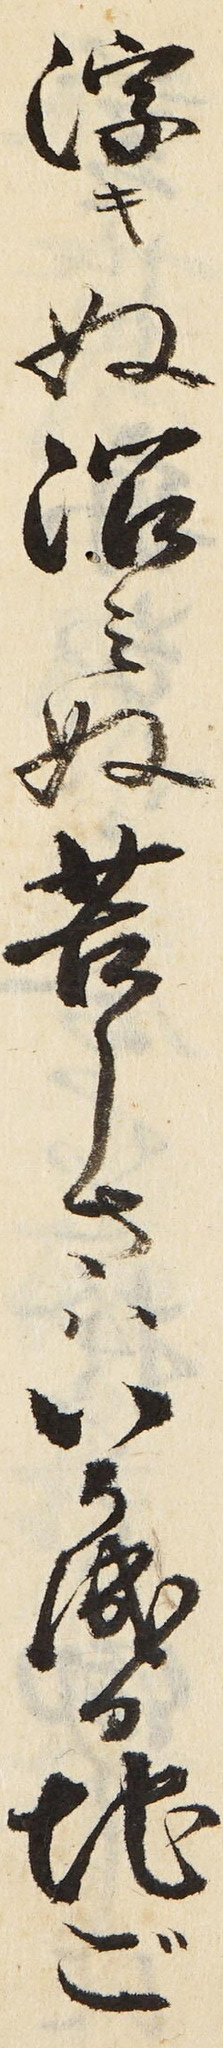浮きぬ溜みぬ苦しさはいか成る地ご
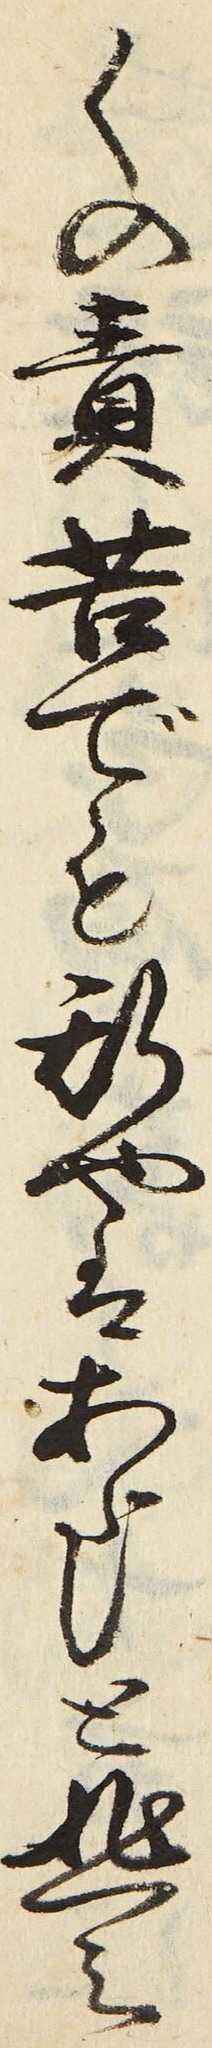くの責苦でも斯やはあらしと悲み
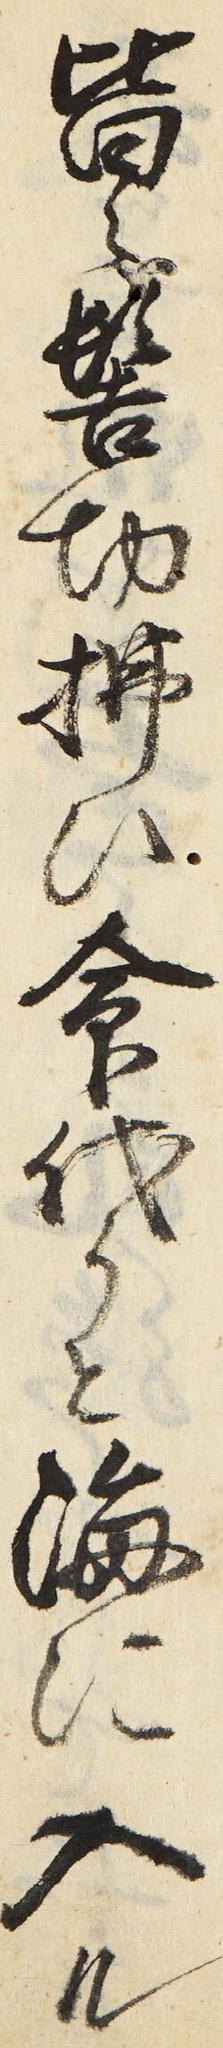皆々髻切払ひ命代りと海に入る
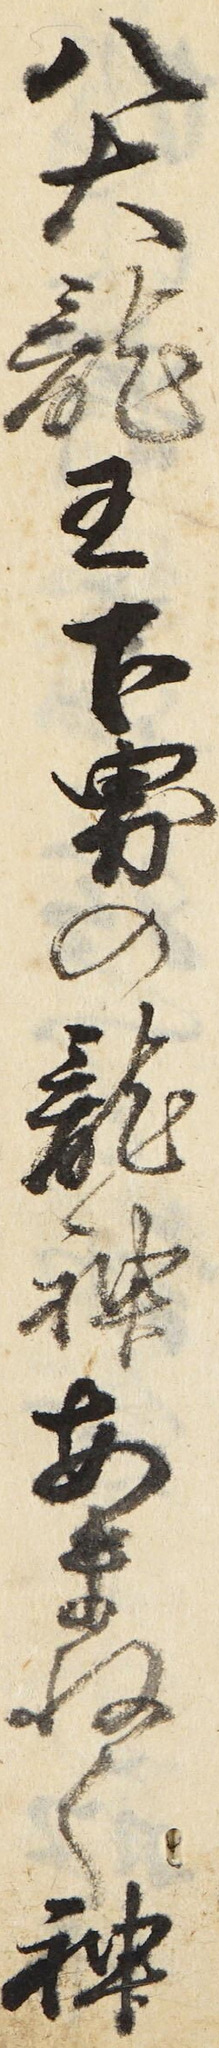八大竜王下男の竜神あまねく神
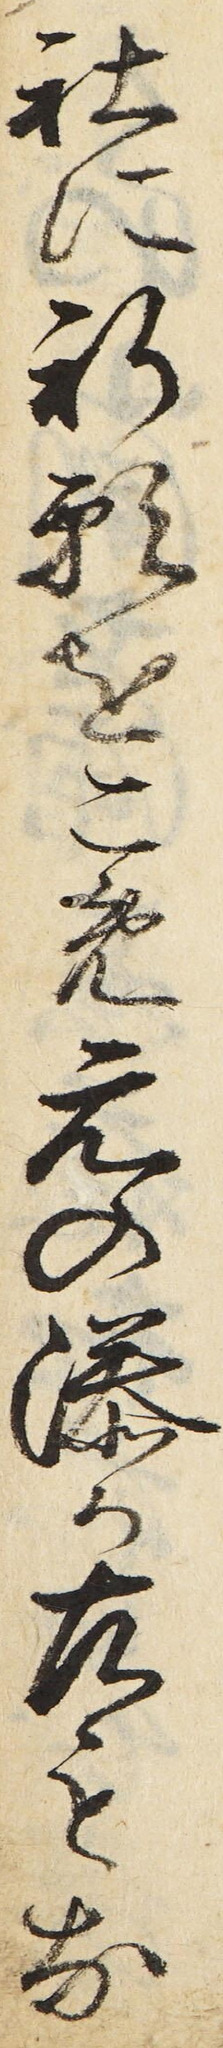社に祈願をこめ元の湊かさもな

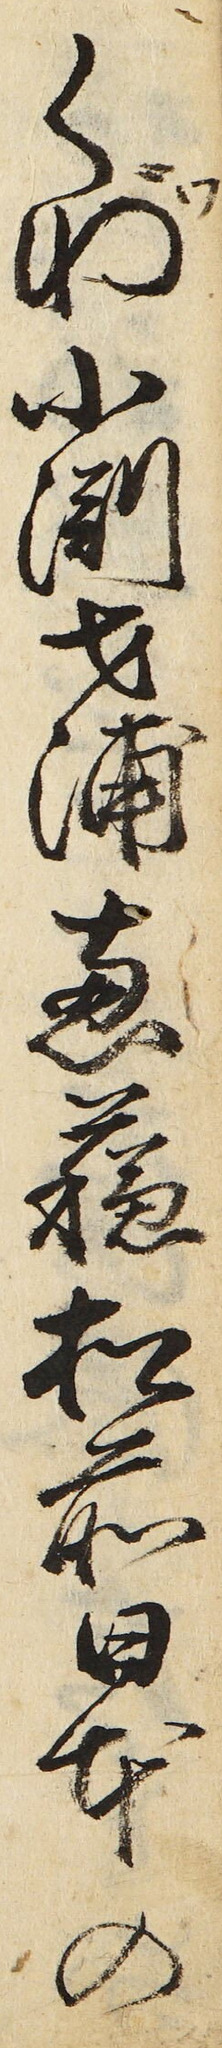くわ小渕才浦恵蘓松前日本の
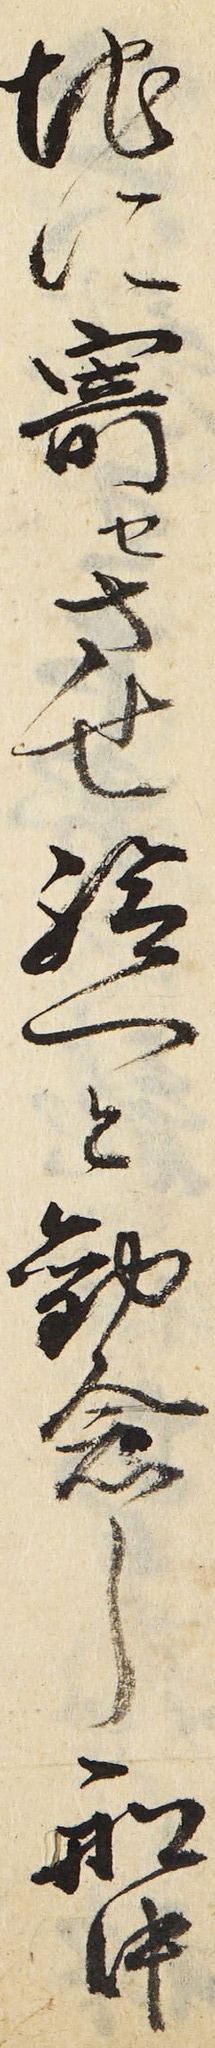地に寄せさせ給へと勧念し船中
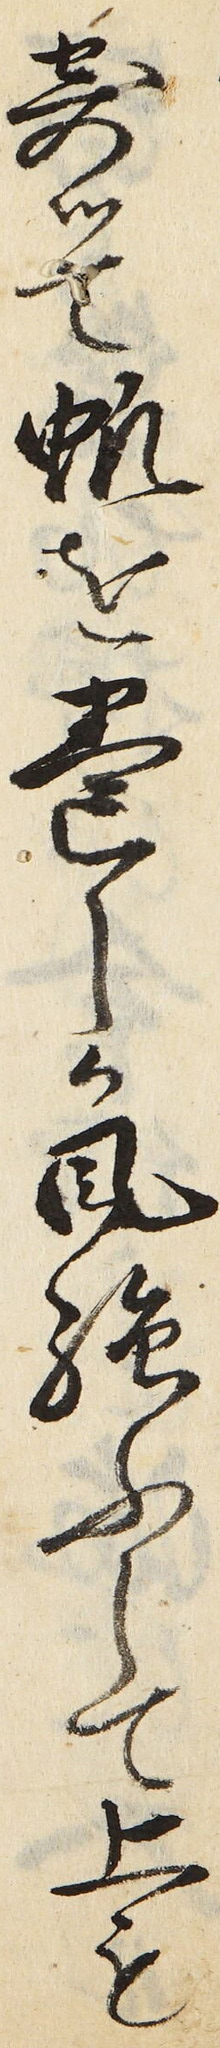寄つて帆を巻しか風強ふして上も
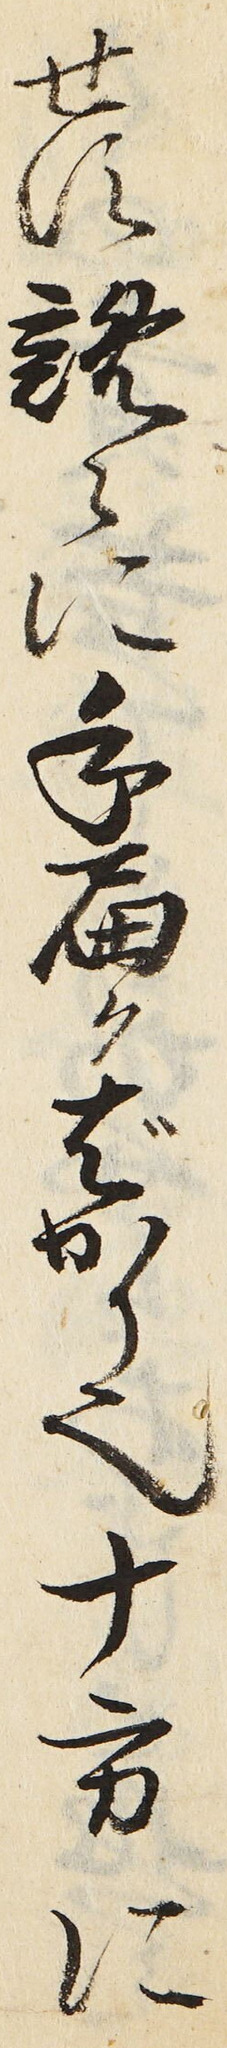せす纔々に手届くばかり也十方に
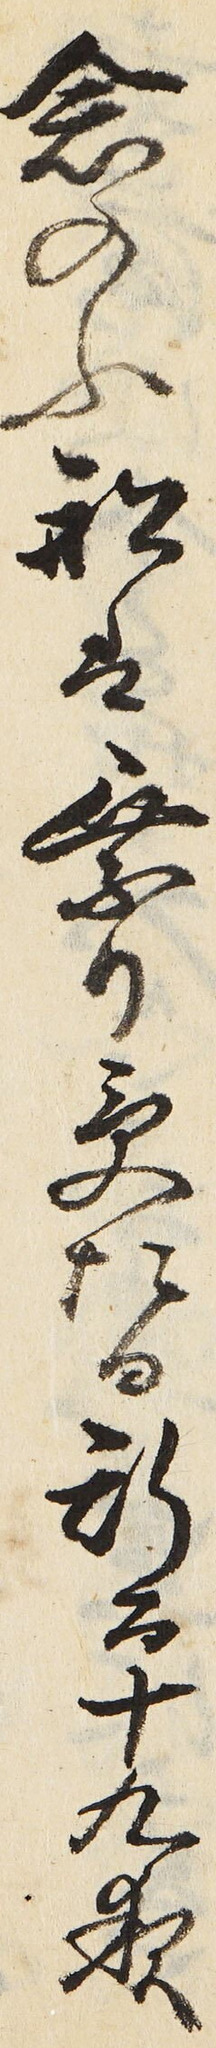念のふ船は乗り受たる斯而十九夜
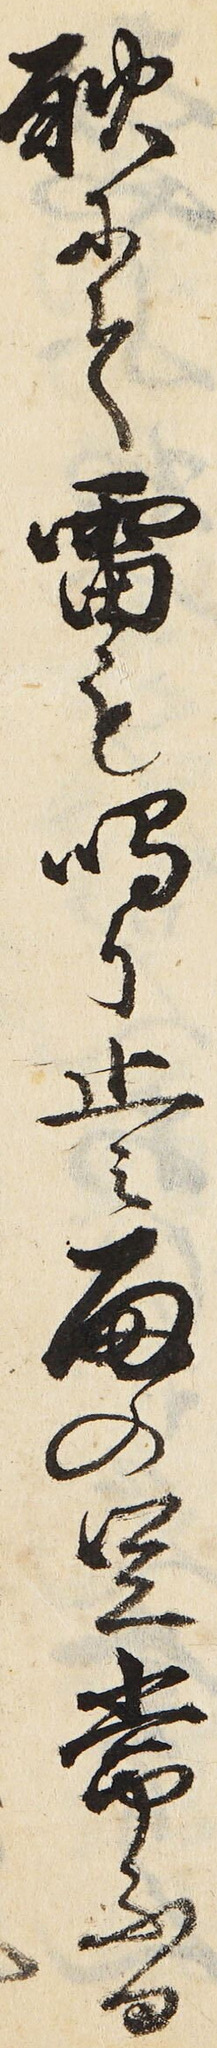耽にて雷も鳴り止み雨の足常ふる
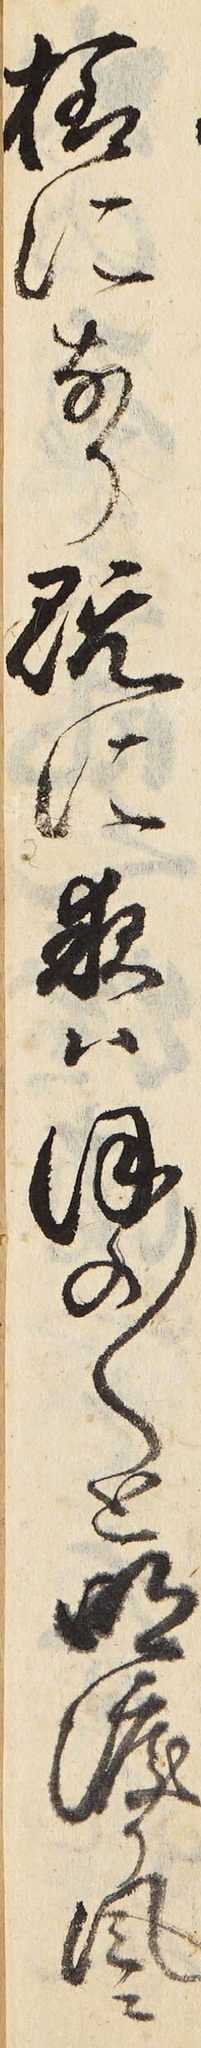様になり既に夜はほの〳〵と明渡り風に
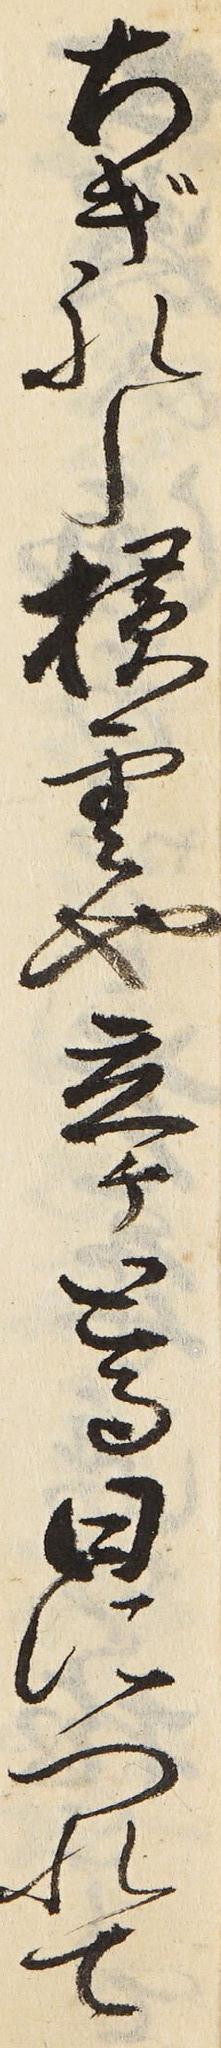ちぎれし横雲や立ちとる日につれて
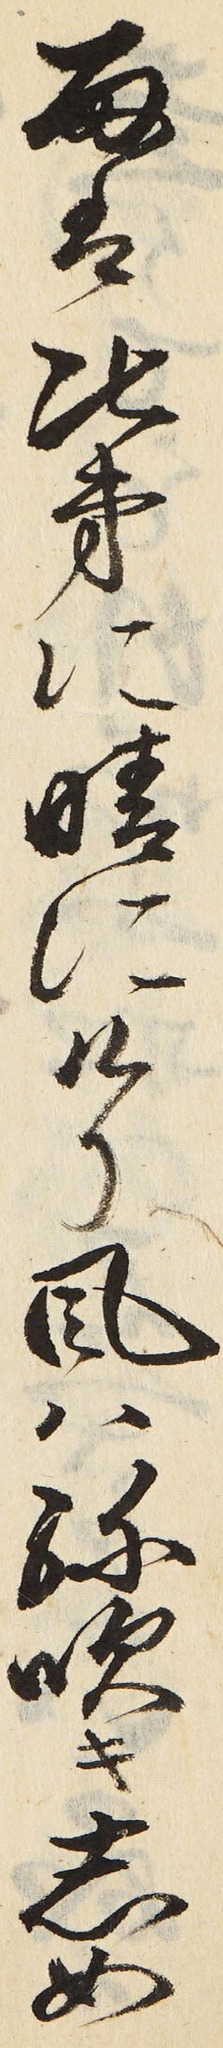雨は次第に晴にけり風は弥吹きしめ
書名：華夷九年録
